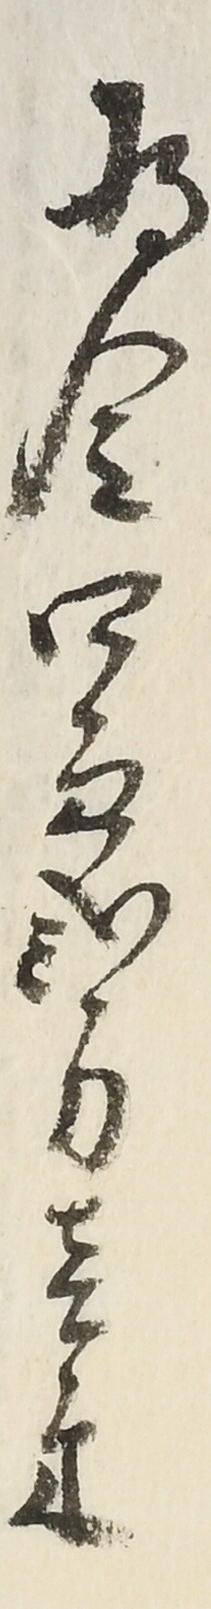為金四両弐分壱朱
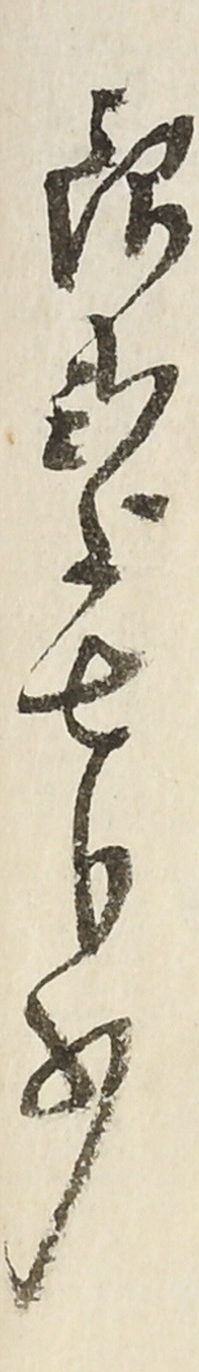銀弐匁七分五厘
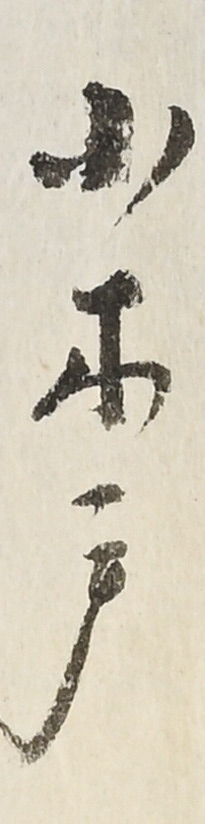小木戸
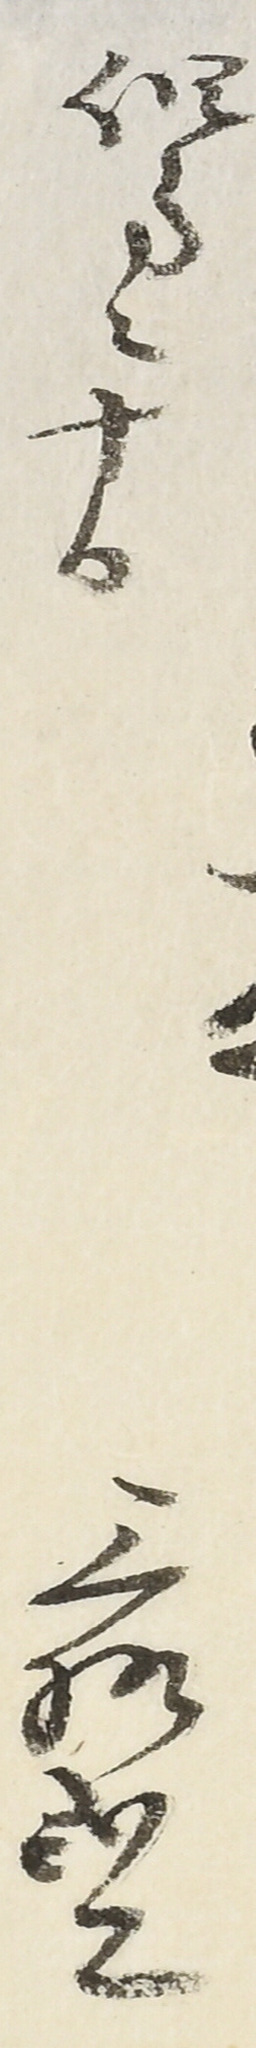但分ニ十日三拾弐工
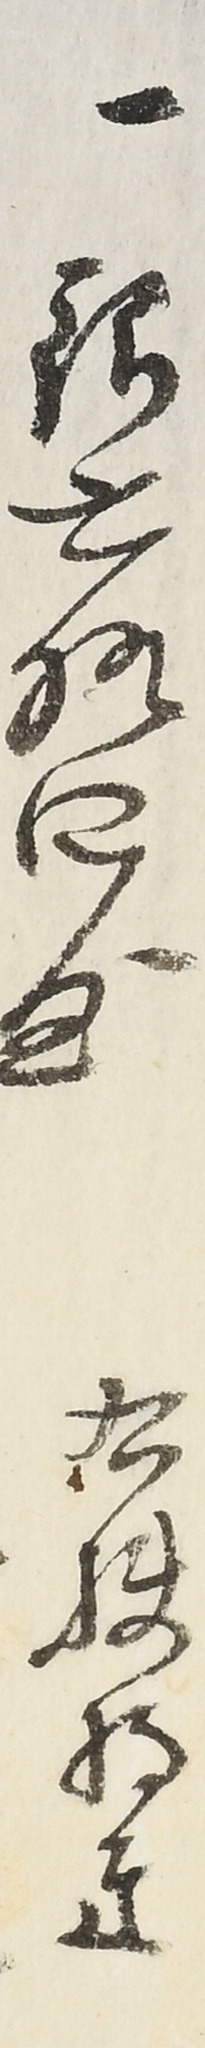一銀六拾四匁右扶持米
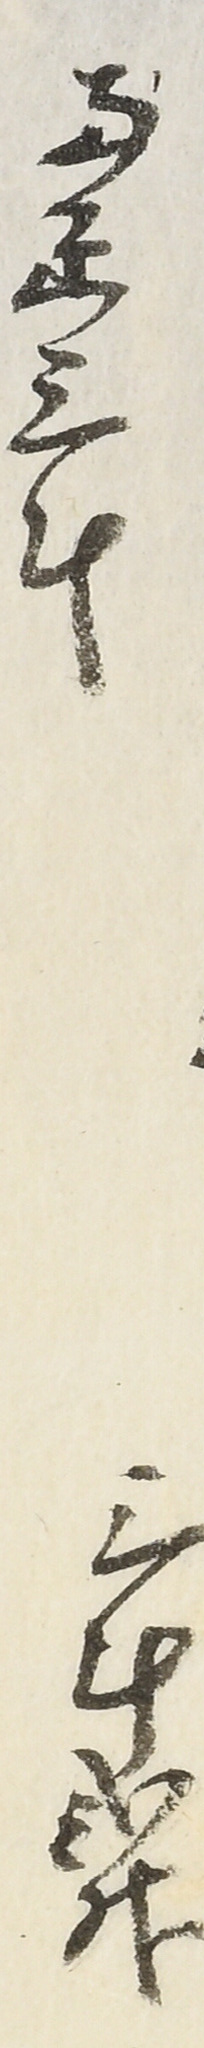両米三斗三斗弐升
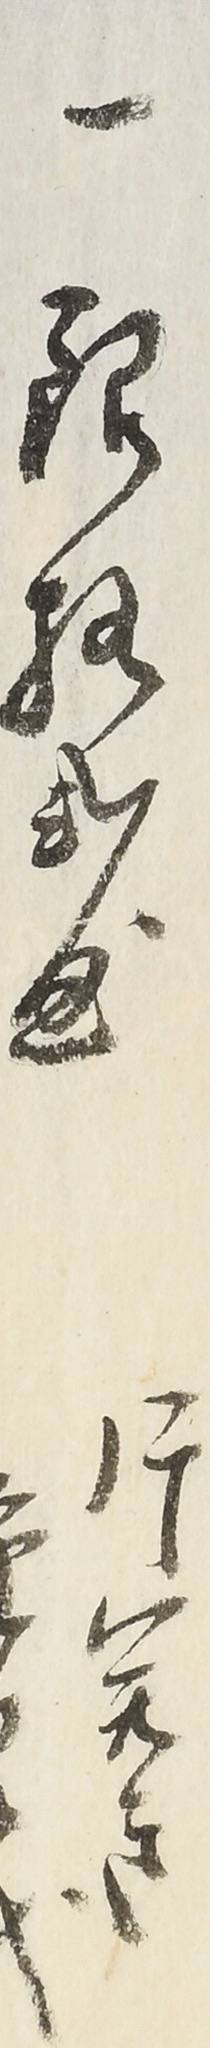一銀拾弐匁片開き
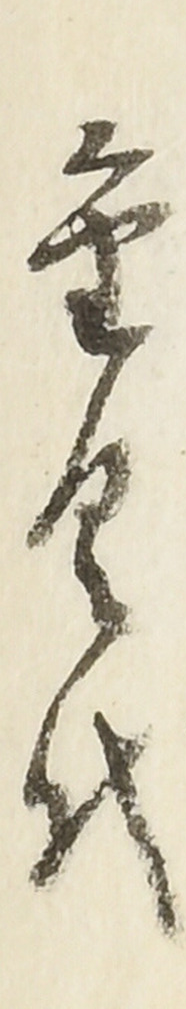金具代
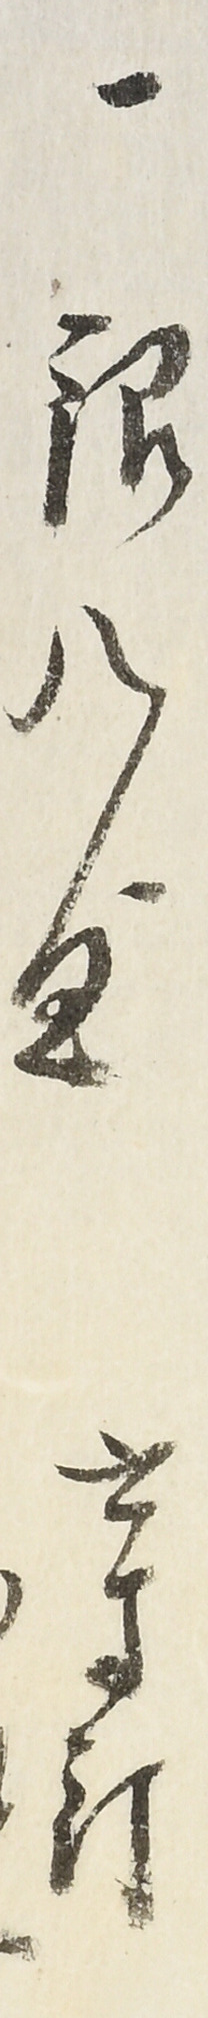一銀八匁六寸釘
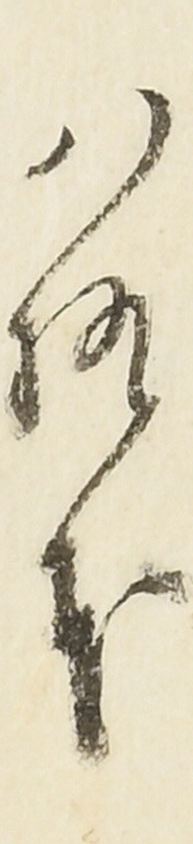八拾本
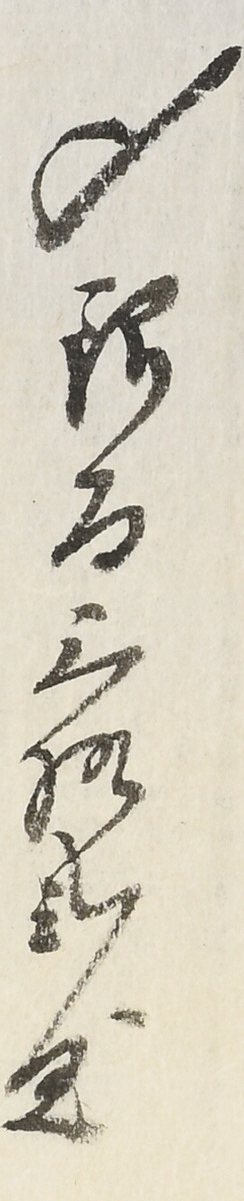〆銀百三拾弐匁
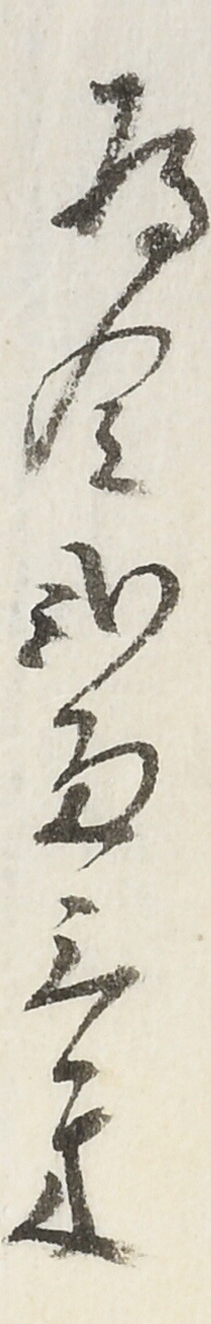為金弐両三朱
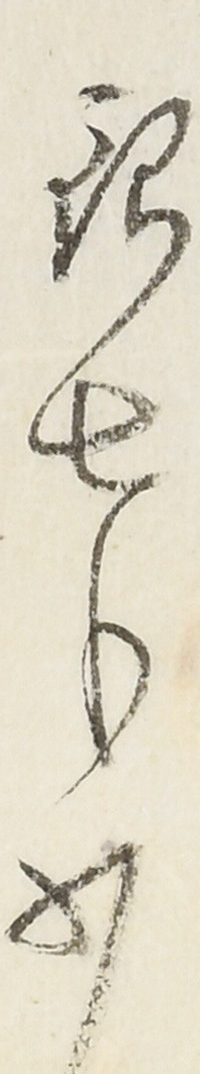銀七分五厘

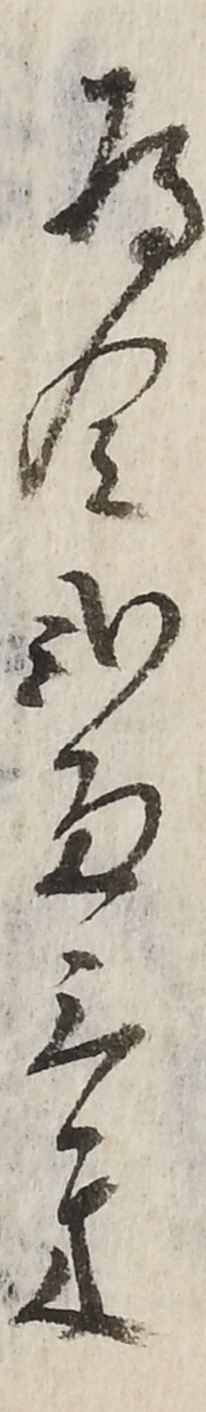為金三分三朱
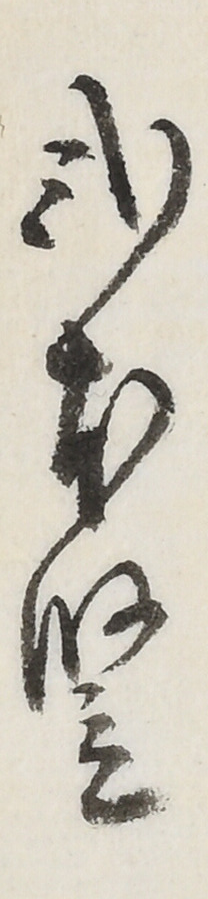弐本竪
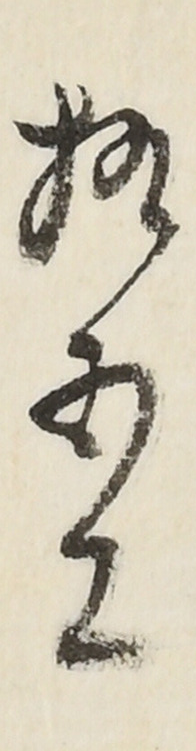拾五工
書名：町方木戸御普請諸事附（一括）
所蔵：伊那市立高遠町図書館・合同会社AMANE
